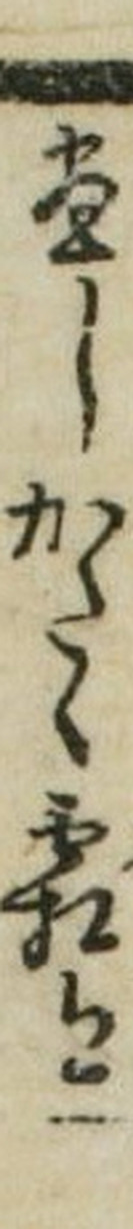尽しかたく霜月
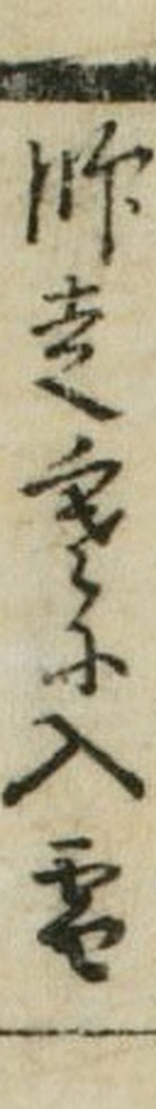師走寒に入雪
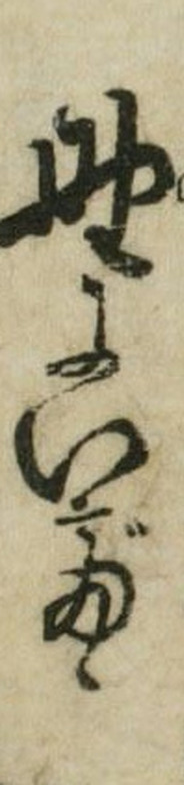野にいでゝ
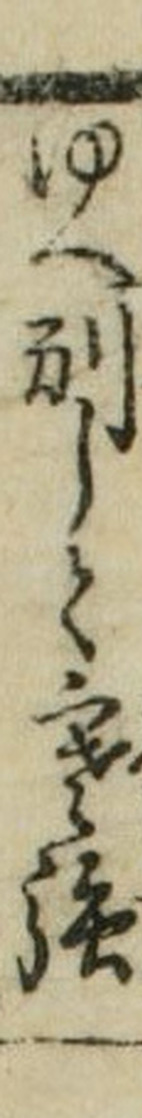ゆへ別して寒強く
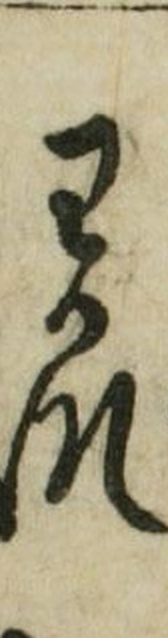わかな
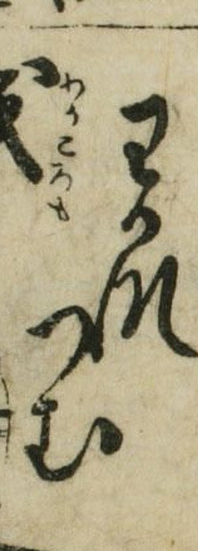わかな
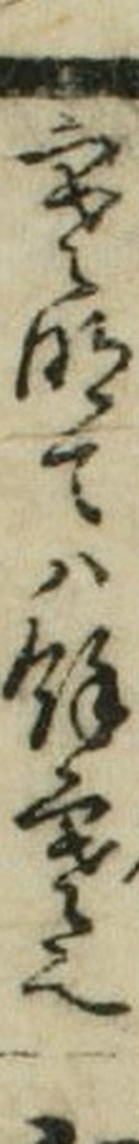寒明ては余寒也
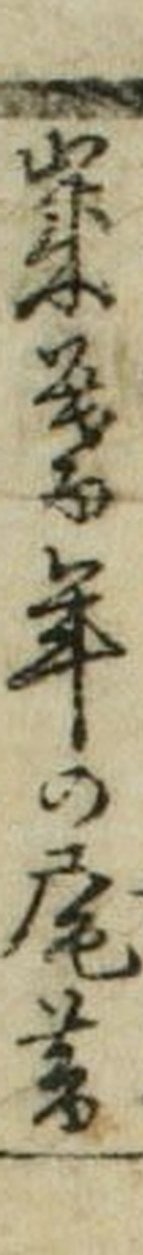歳暮年の尾暮
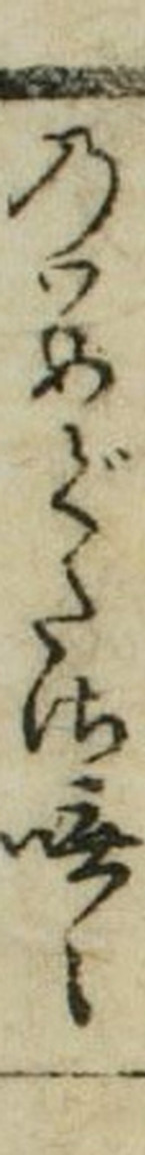の御めでたさ嘸々
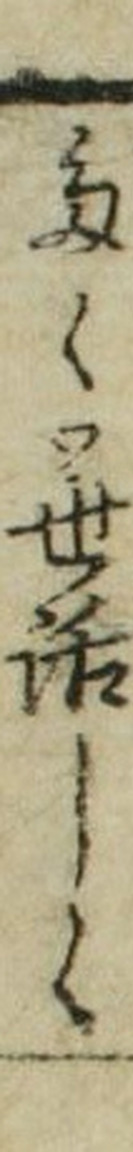多く御世話しく

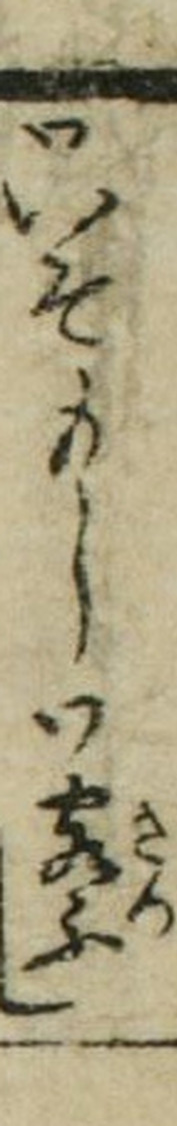御いそもし御察し
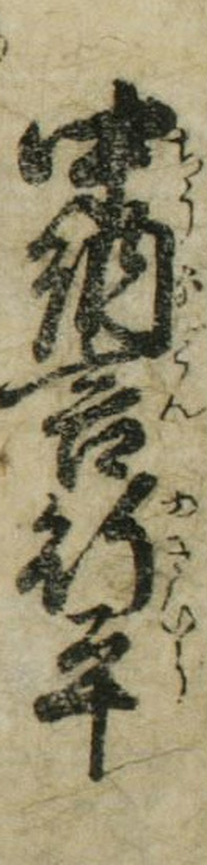中納言行平
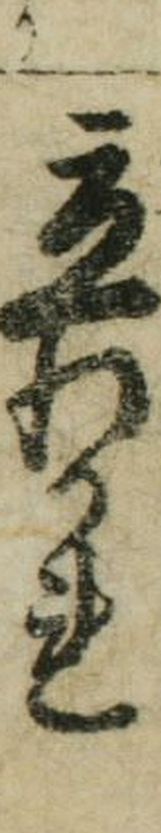立わかれ
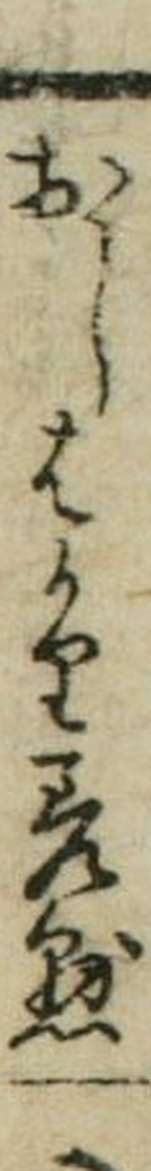おしはかり差懸
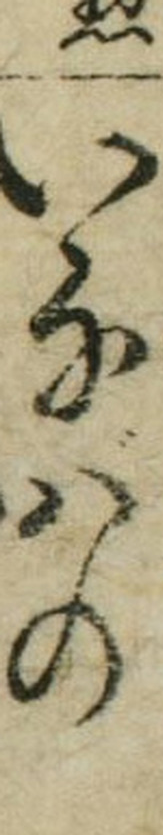いなばの
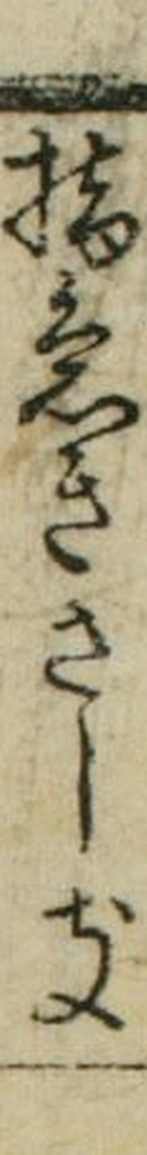指急きさし支
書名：百人一首
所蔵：東京学芸大学教育コンテンツアーカイブ
